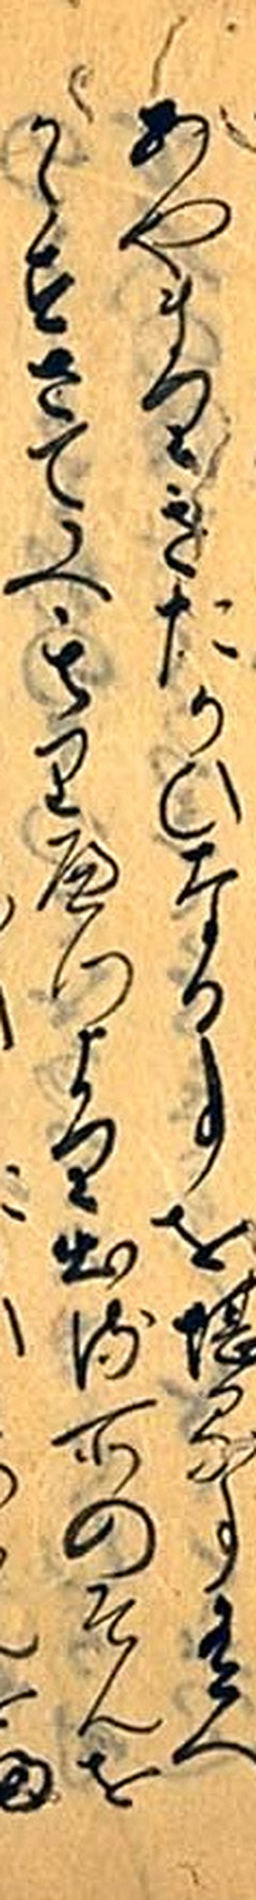からすさて又其りへつより出る所のそんを
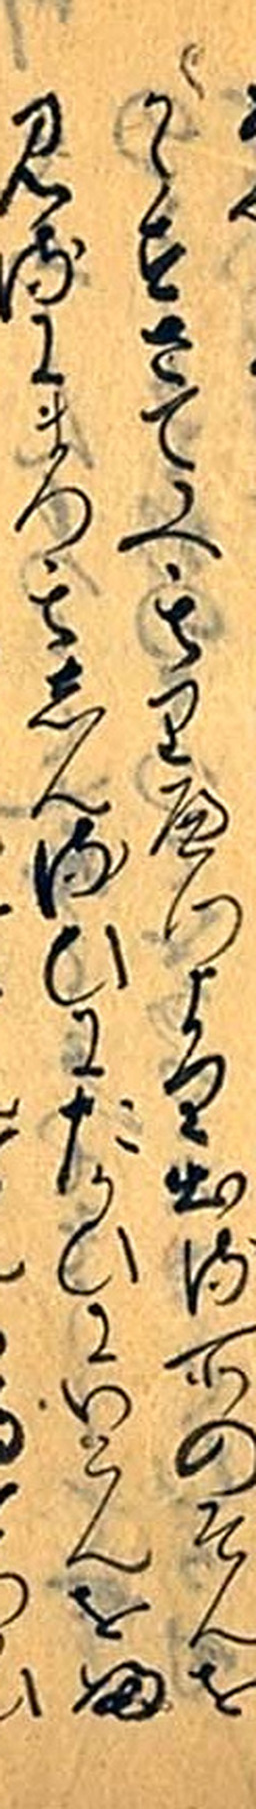見るにまつ其しんるひにたかいにいこんをふ
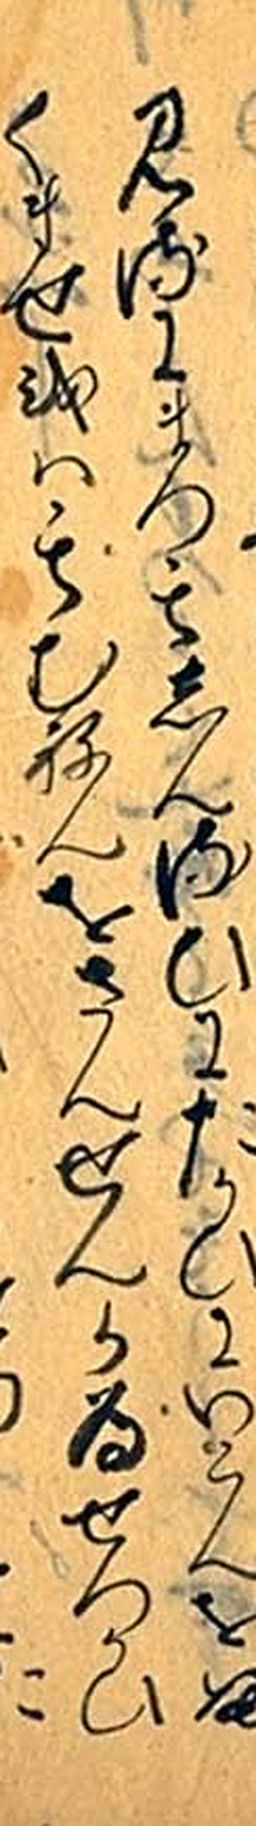くませ或は其むねんをさんせんか為せつかひ
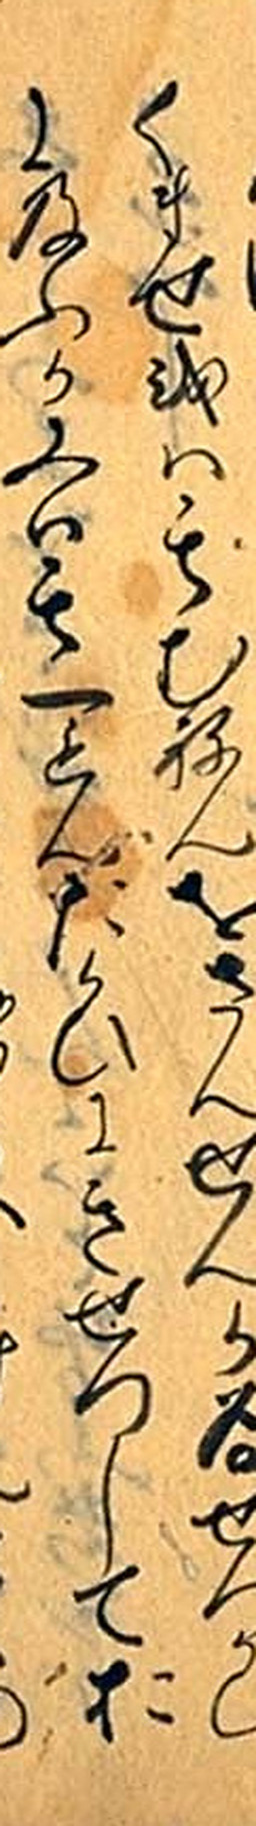に及ふか又は其一もんたかひにきせつしてお
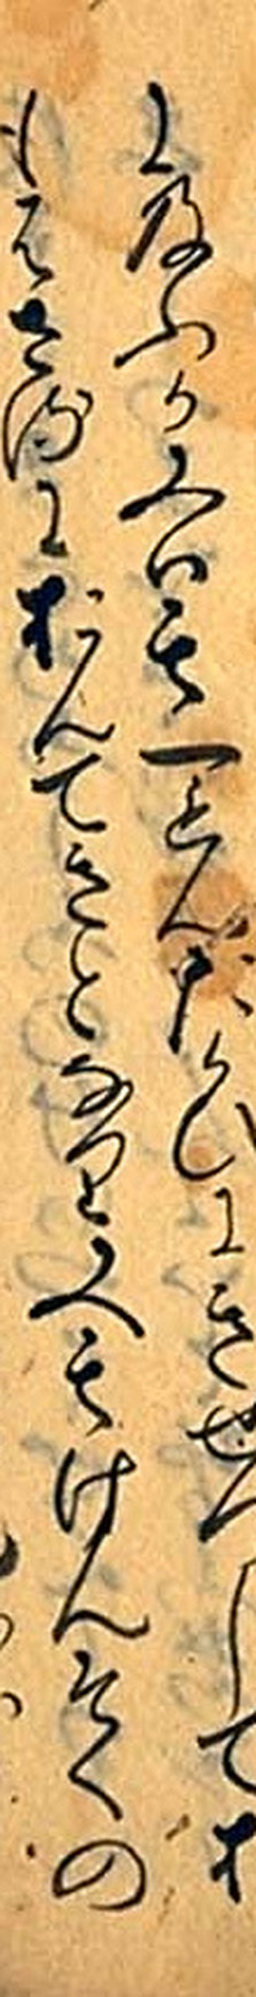もはさるにおんてきとなり又其けんそくの
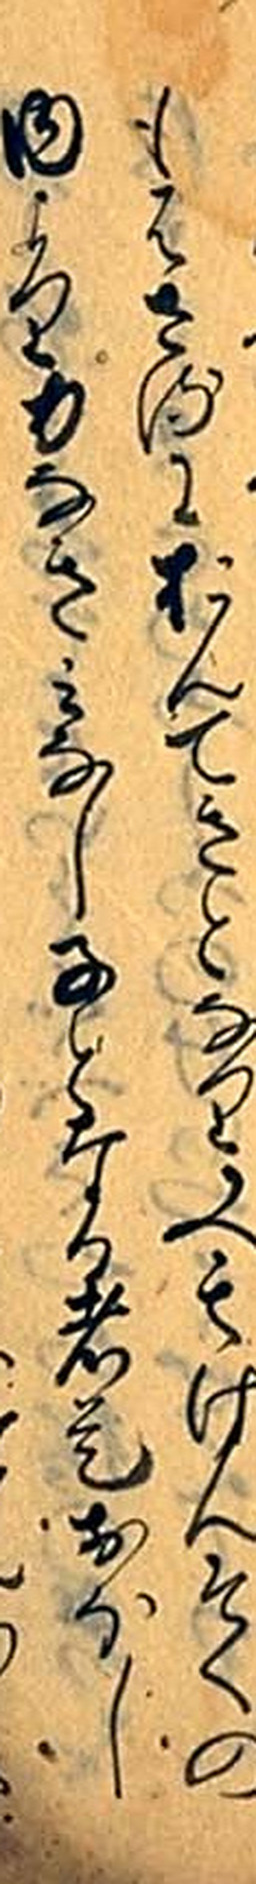内より力なきみなし子となる者是おほし
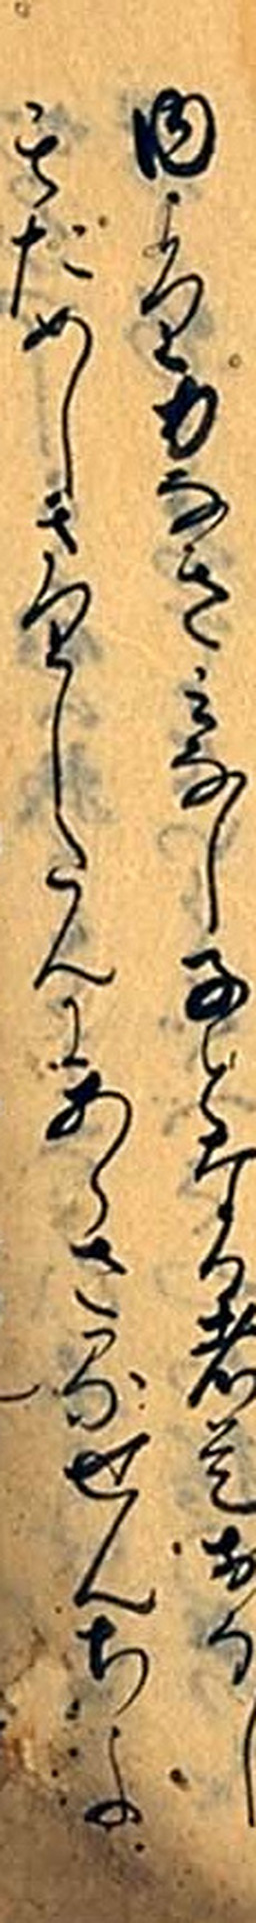其ためしきりしたんにあらさるせんちよ
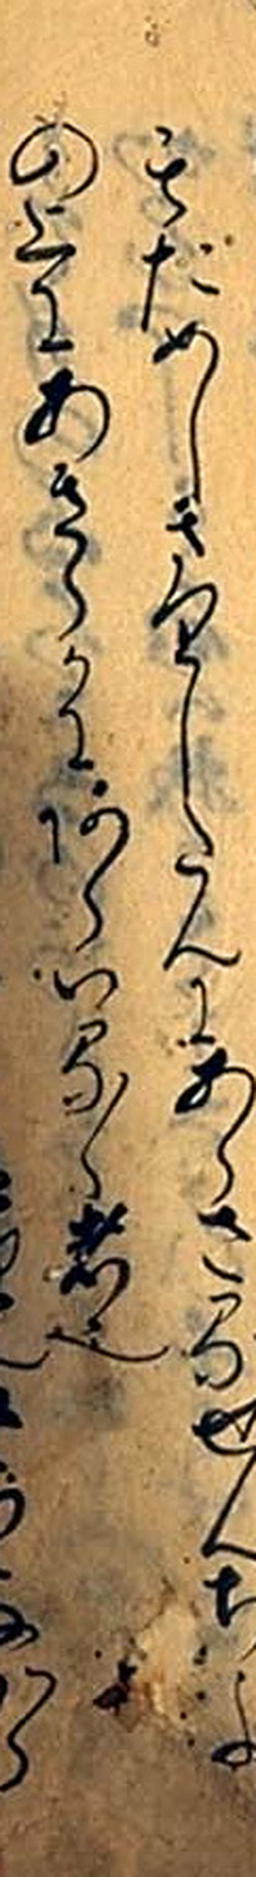の上にあきらかにあらはるゝ者也
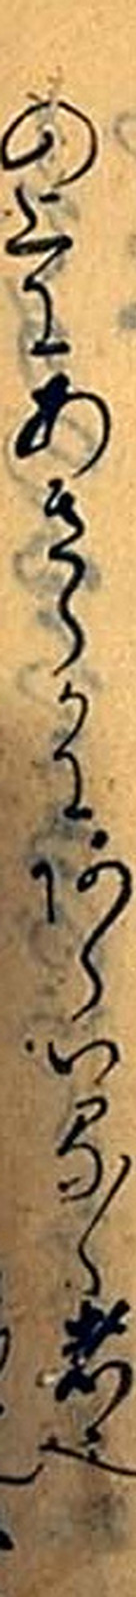の上にあきらかにあらはるゝ者也
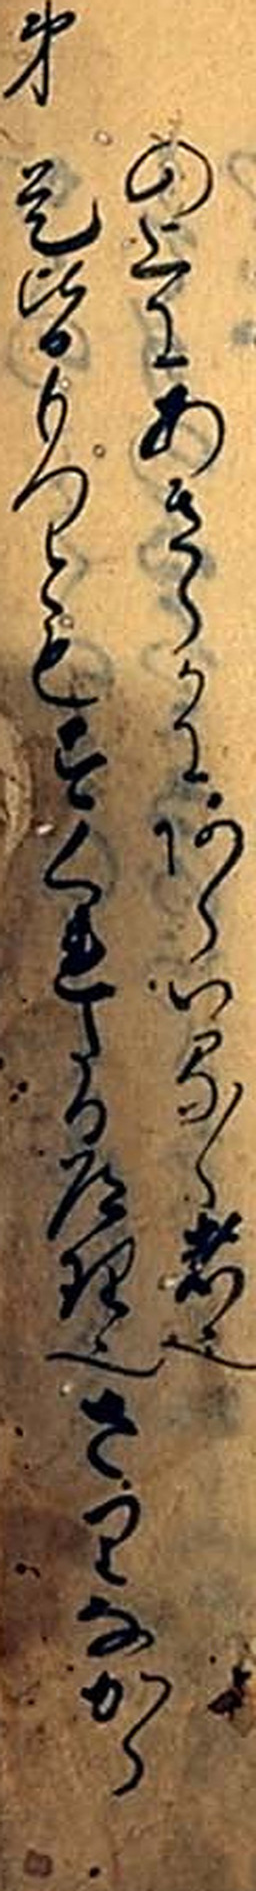弟是皆もつともすくれたる道理也さりなから

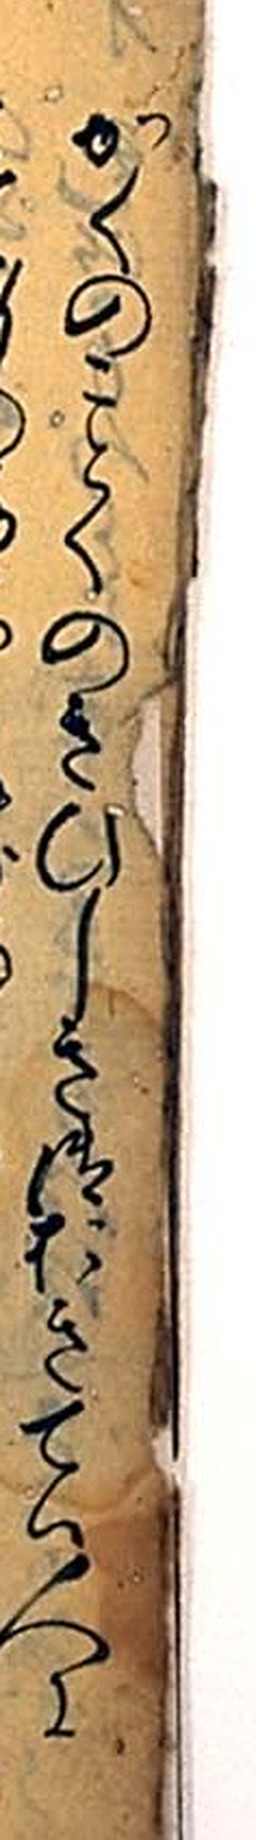かくのことくのきひしき御おきては人に
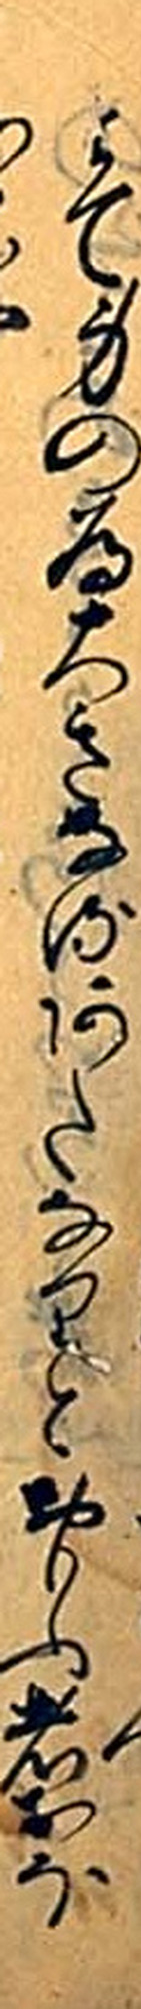よて身の為大きなるあたなりとおもふ者おほ
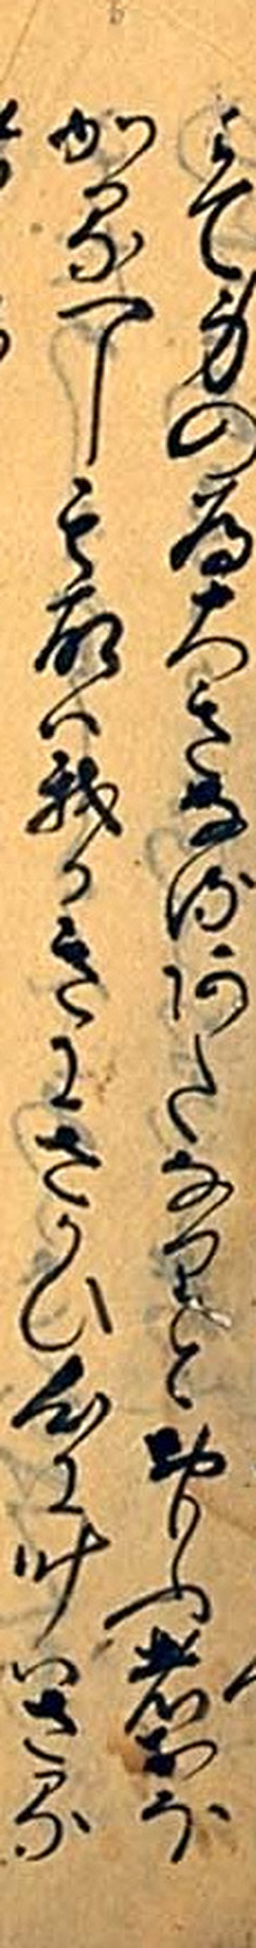かるへし其故は我かきにさかひ心に叶はさる
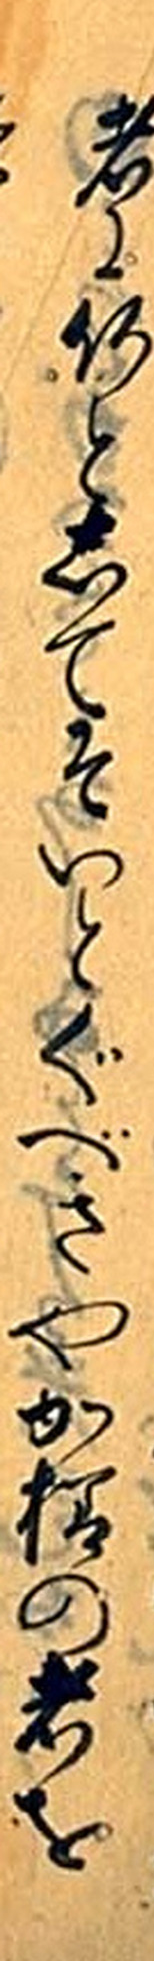者に何としてそいとぐべきやか様の者を
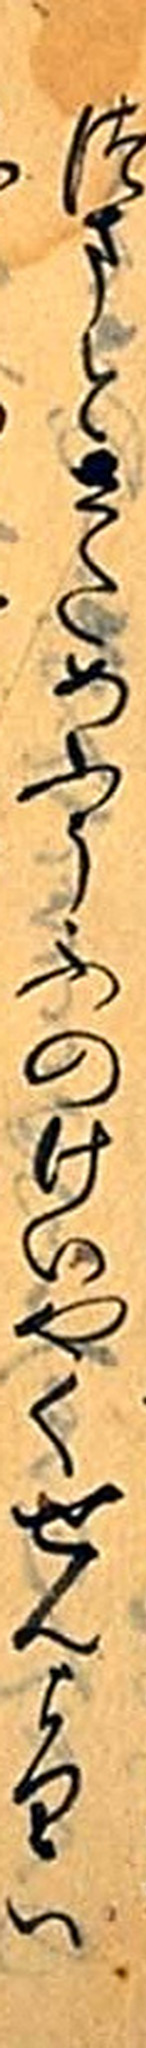つまとさためふうふのけいやくせんよりは
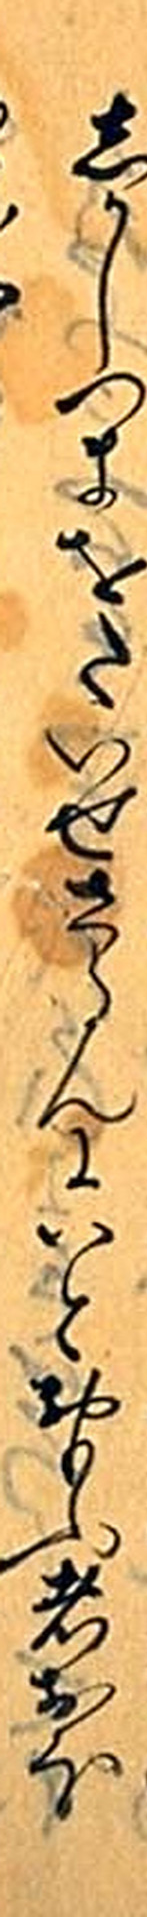しかしつまをたいせさらんにいとおもふ者おほ
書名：ドチリナ・キリシタン
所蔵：東京大学総合図書館 / General Library in the University of Tokyo
